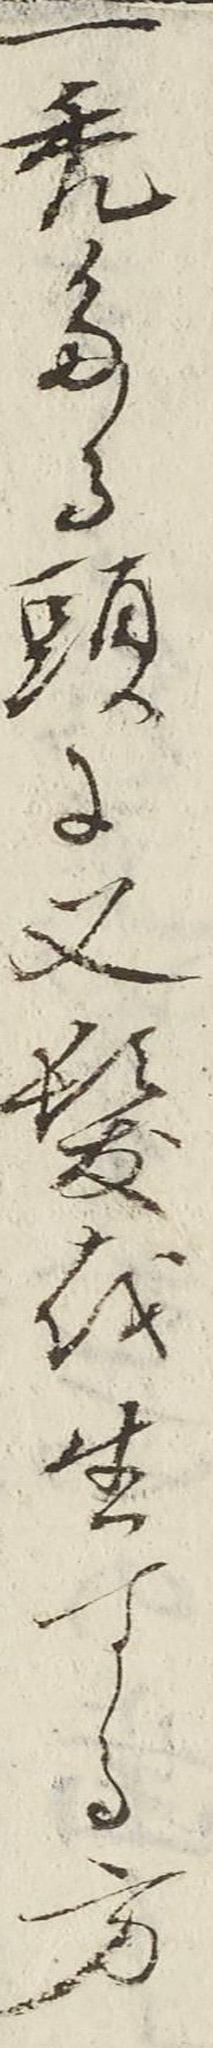一禿たる頭に又髪を生する方
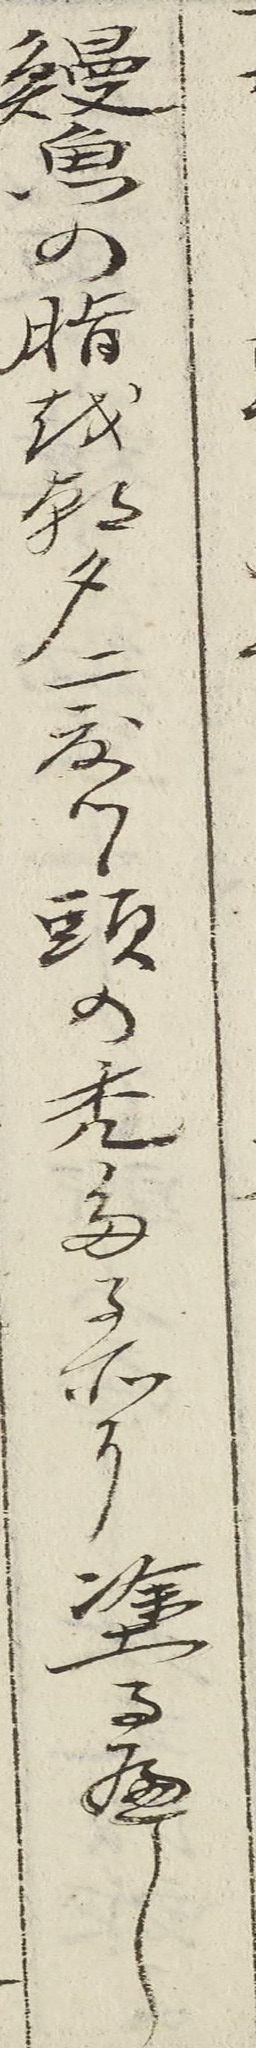鰻魚の脂を朝夕二度ツゝ頭の禿たる所に塗るへし
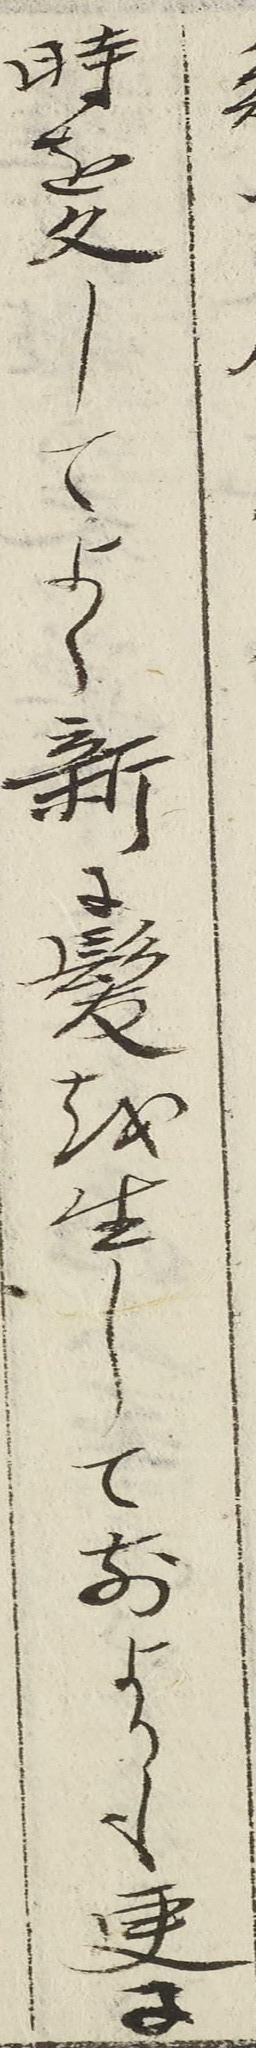時を久してよく新に髪を生して前よりも更に
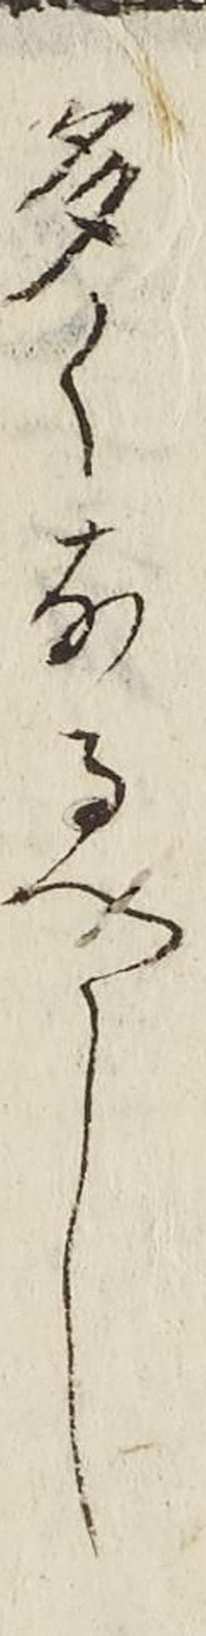多くなるへし
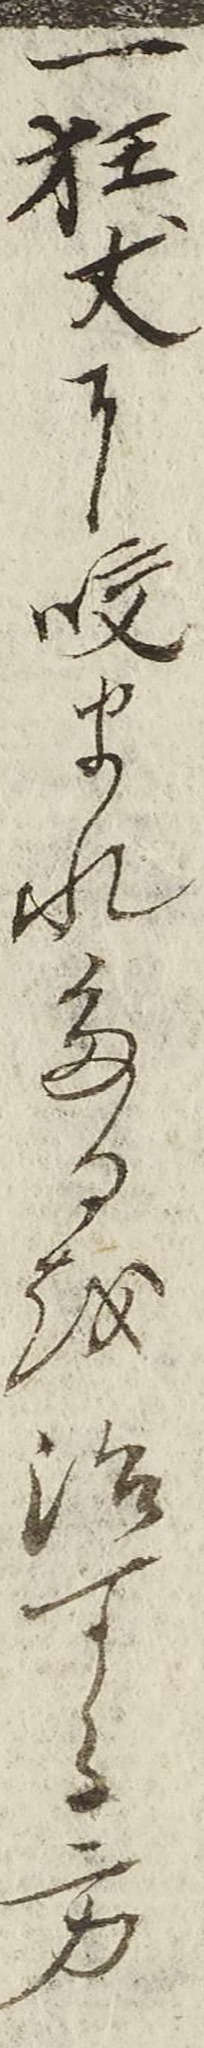一狂犬に咬まれたるを治する方
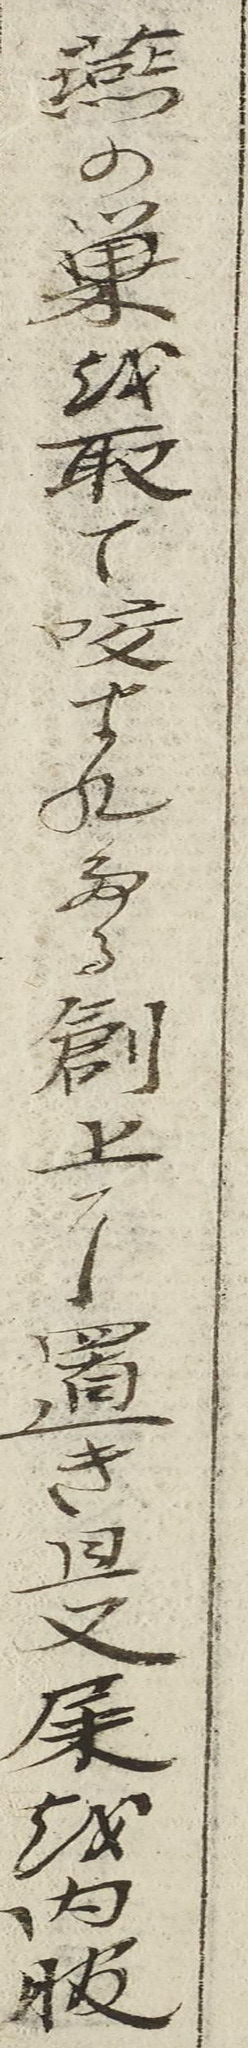燕の巣を取て咬まれたる創上に置き且又尿を内服
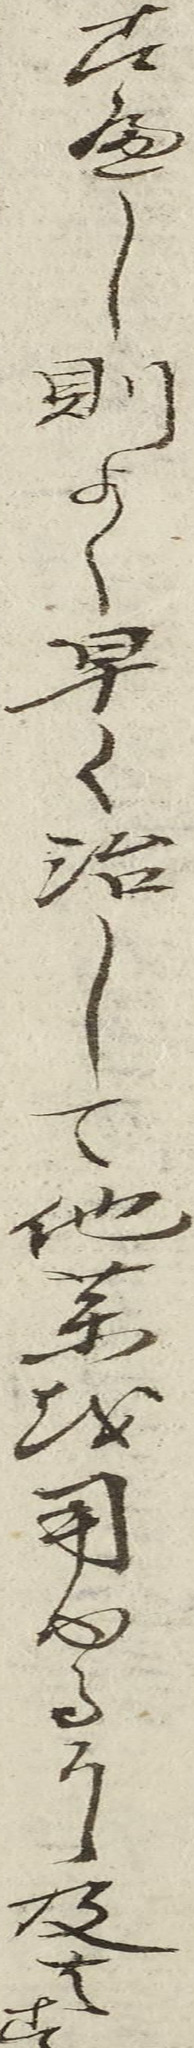すべし則よく早く治して他薬を用ゆるに及はす
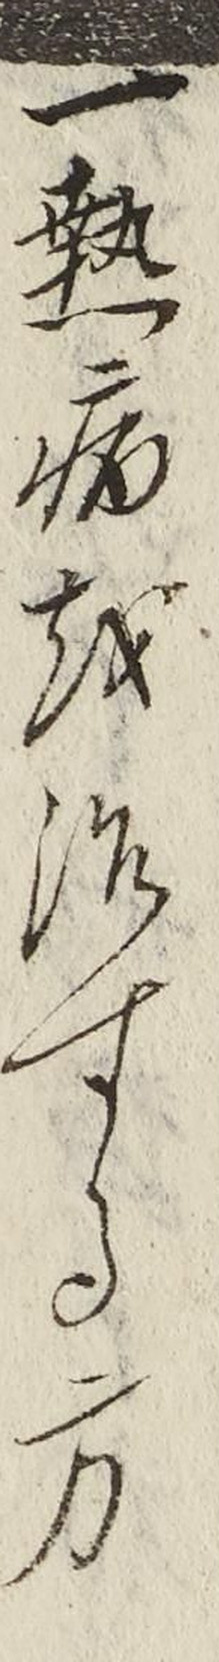一熱病を治する方
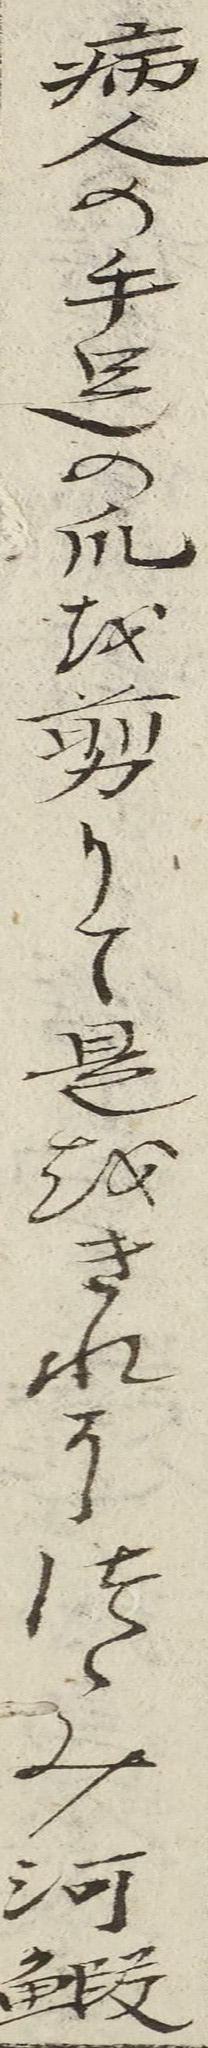病人の手足の爪を剪りて是をきれにつゝみ皮鰕
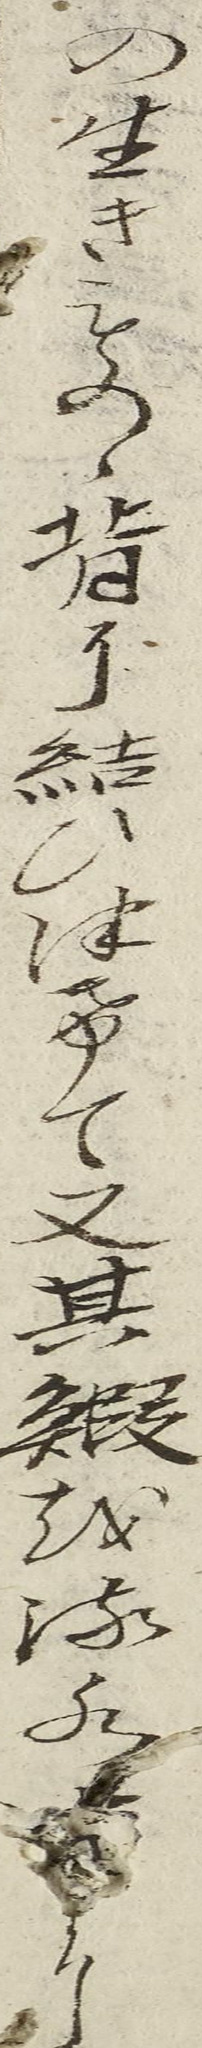の生きものゝ背に結ひつけて又蝦を流水中に
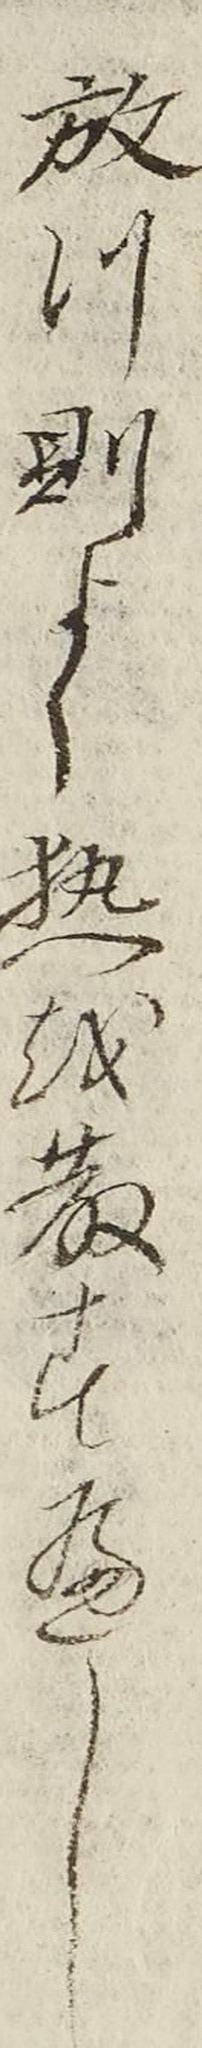放つ則よく熱を散すへし
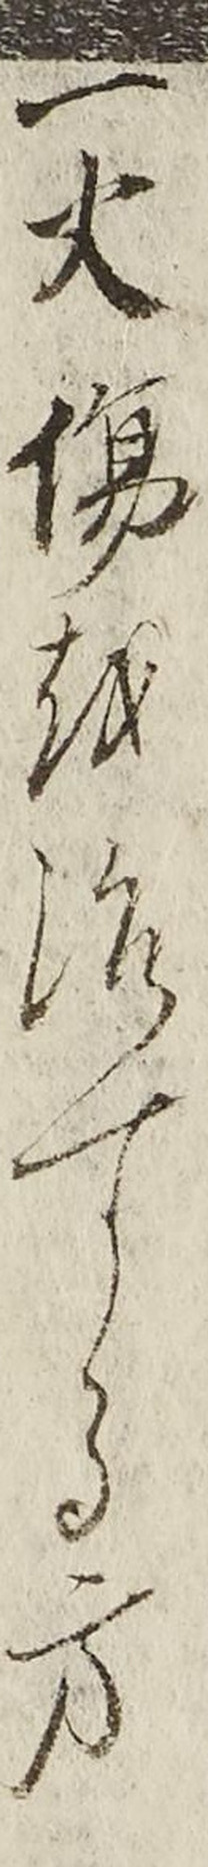一火傷を治する方
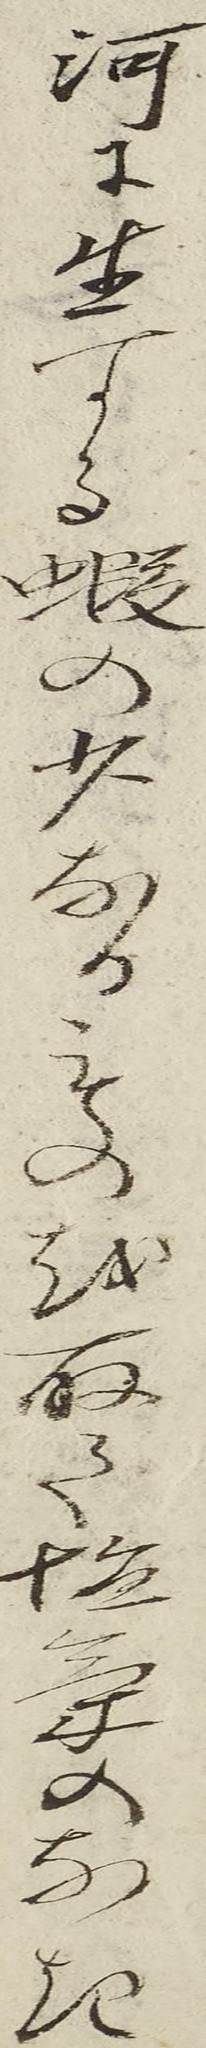河に生する鰕の少なるものを取て塩気のなき

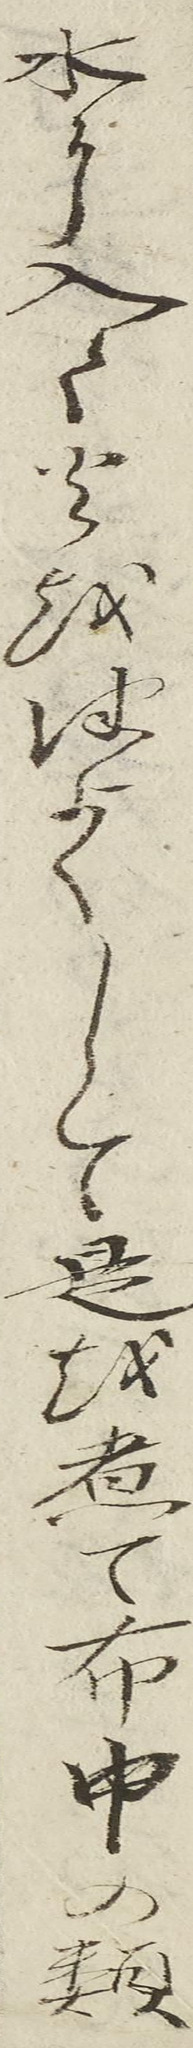水に入て火をつよくして是を煮て布巾の類
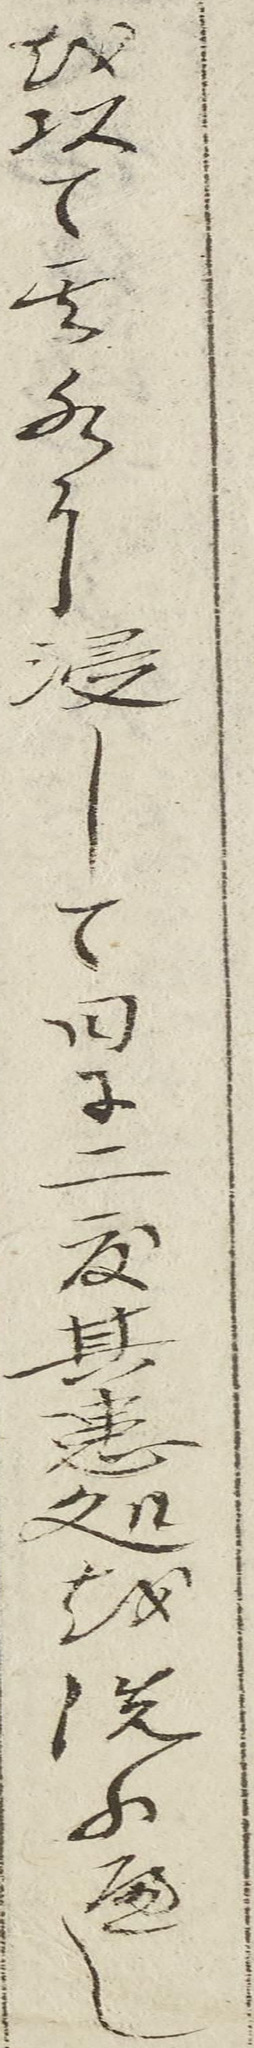を以て其水に浸して日に二度其患処を洗ふへし
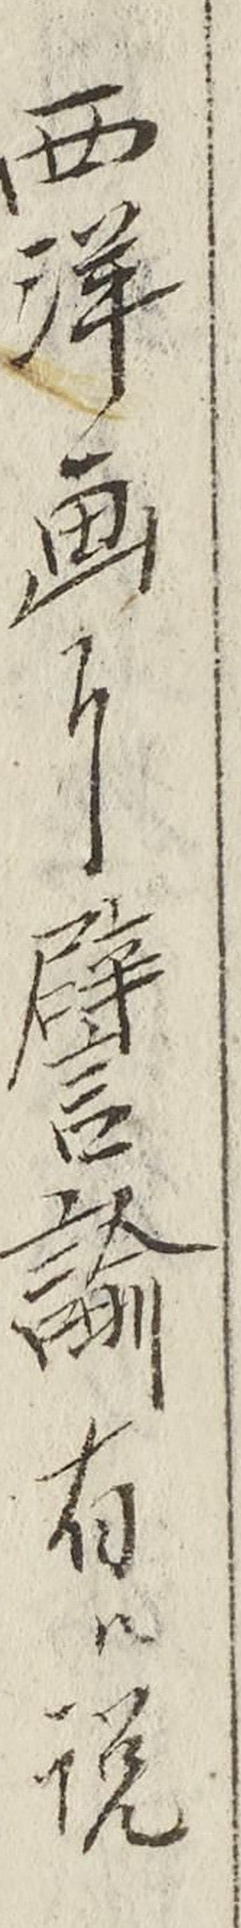西洋画に譬論有ㇽ説
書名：西洋雜記　坤
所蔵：東京大学地震研究所図書室 Earthquake Research Institute Library, The University of Tokyo, JAPAN
